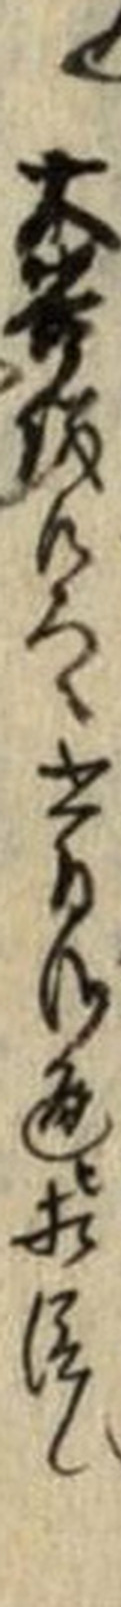大谷儀左衛門へ書付弐通被相渡候
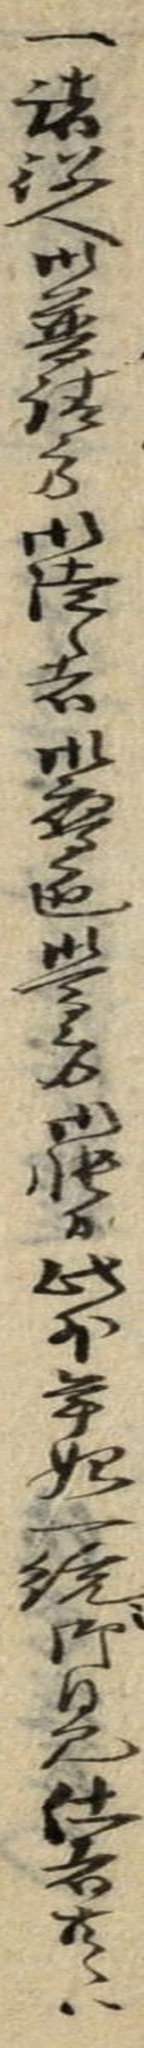一諸役人御普請方御徒之者御鷹匠御馬方御帳付此外年始一統之御目見仕者共へは
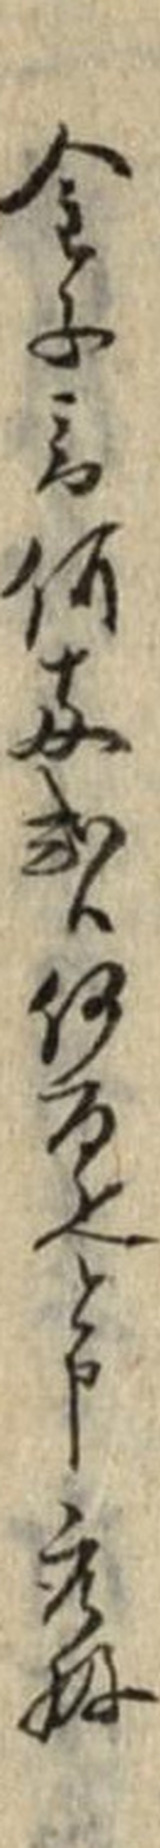金子に而何両或は何百疋と申取扱
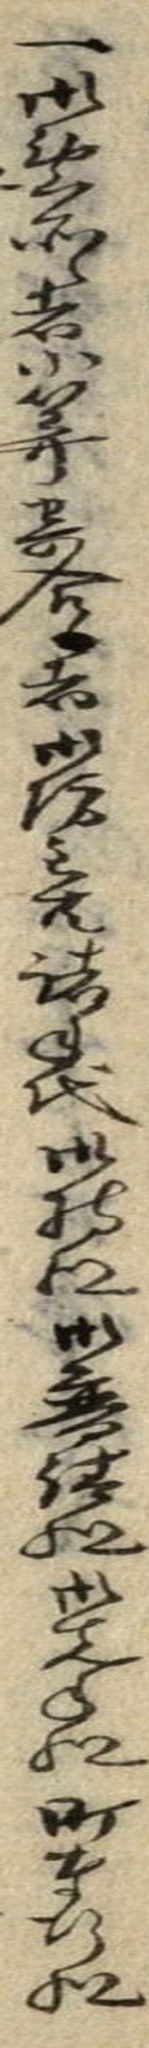一御台所之者小算寄合之者御坊主共諸手代御持組御普請組御先手組町奉行組
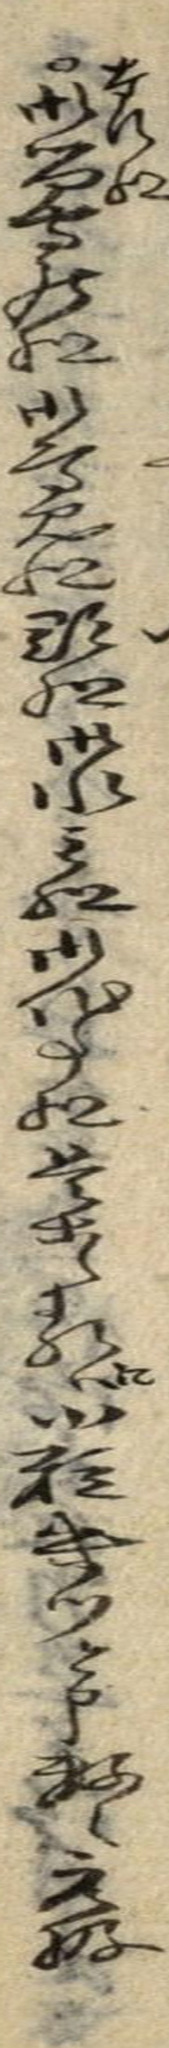奉行組御留守居組御鳥見組郡組御水主組御作事組是等之類江は小粒幾つと申数之取扱
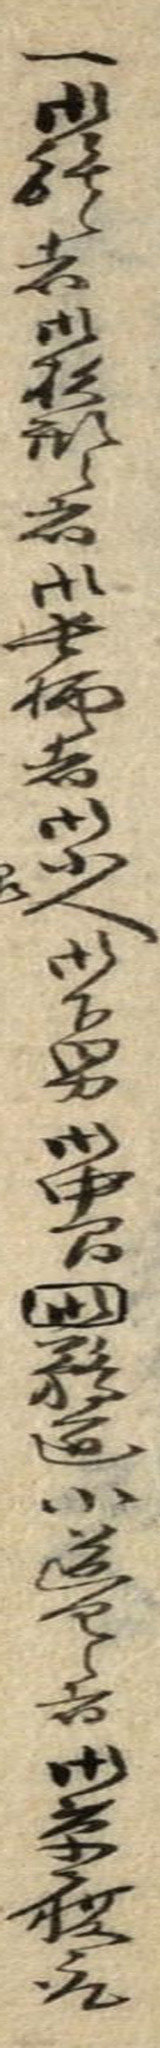一御旗之者御杉形之者御長柄之者御小人御下男御中間御鵜匠小道具之者御草履取
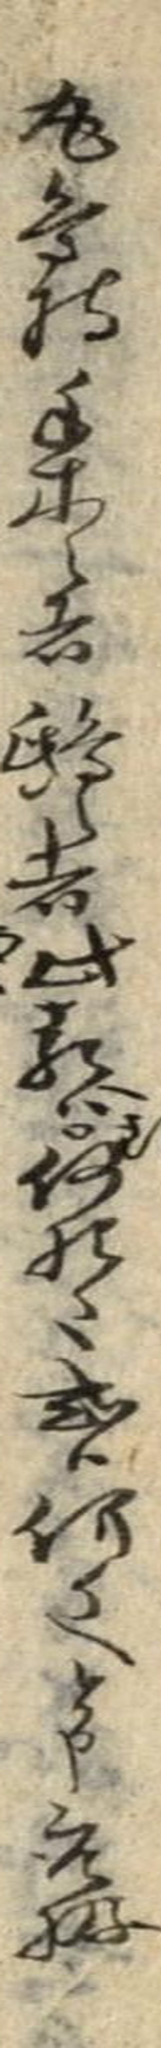丸鳥持手木之者鴟之者此類へは銀何拾匁或は何匁と申取扱
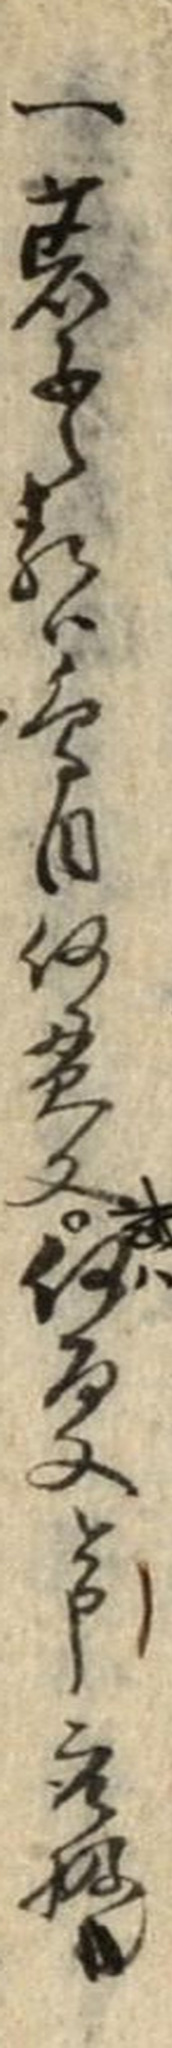一荒子之類は鳥目何貫文或は何百文と申取扱
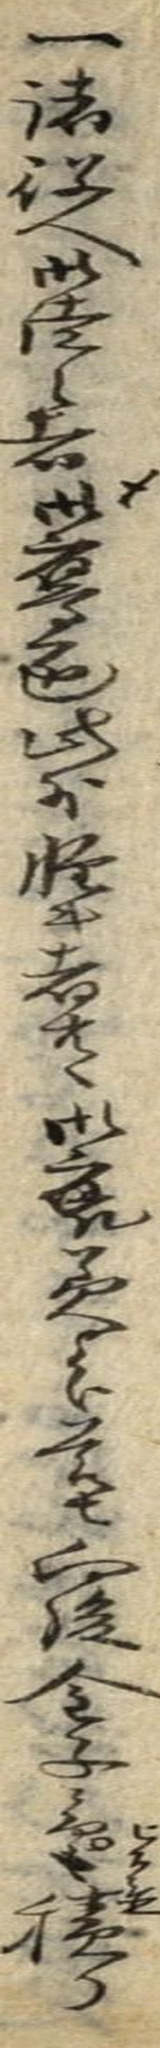一諸役人御徒之者御鷹匠此外軽き者共へ御褒美被下候節は向後金子に而被下置積り
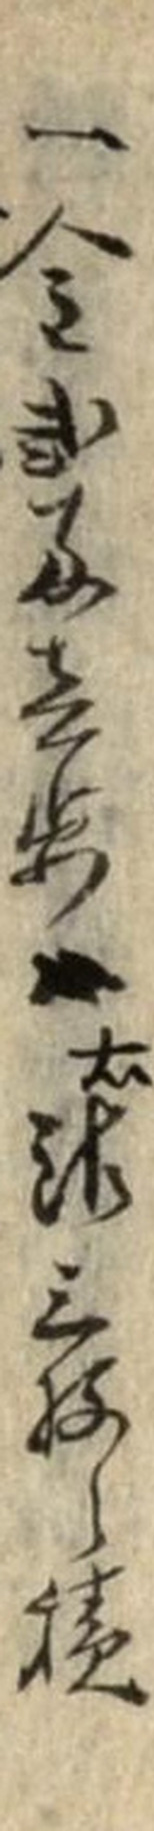一金三歩右銀壱枚之積
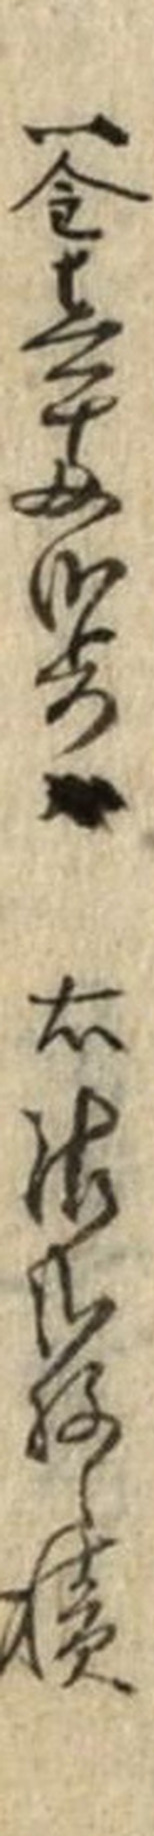一金三歩右銀壱枚之積

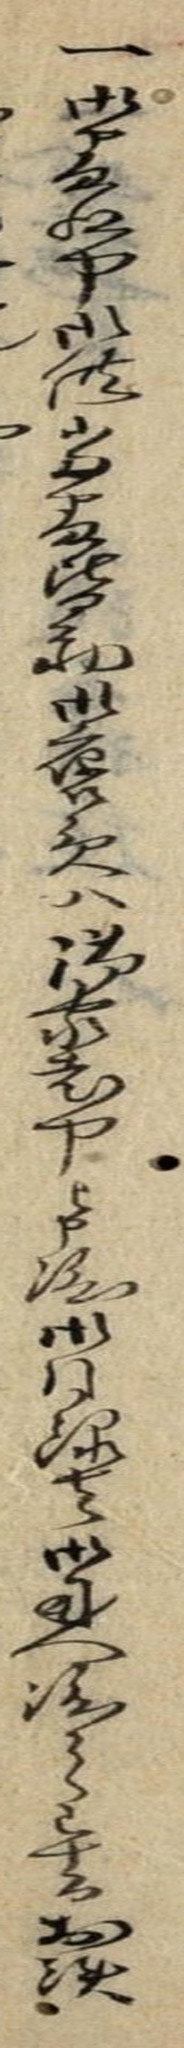一御番組中御供当番皆勤御褒美は御家老中被申渡御目録は御用人渡之畢而於鉄
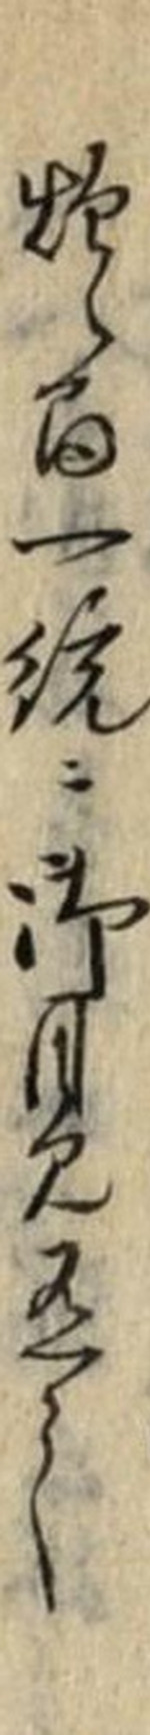炮之間一統に御目見有之
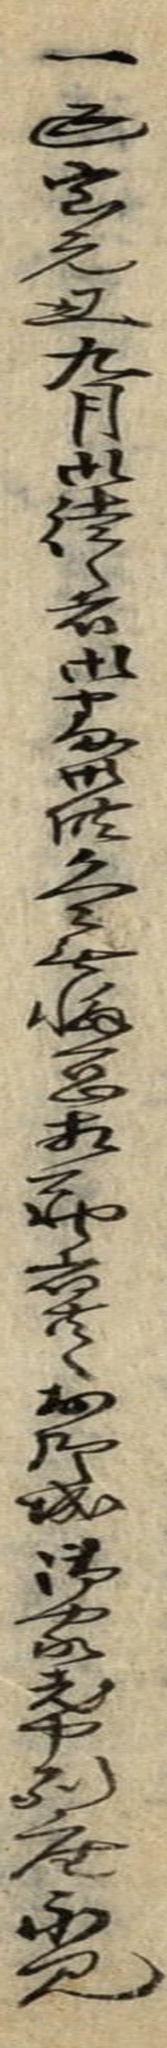一延宝元丑九月御徒之者御番御供久々無懈怠相勤候者共へ於御城御家老中列座永見
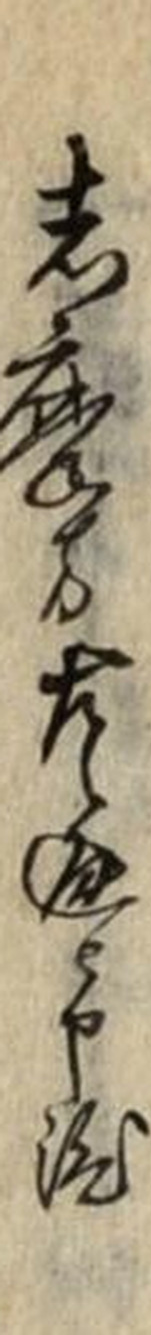志摩方左之通被申渡
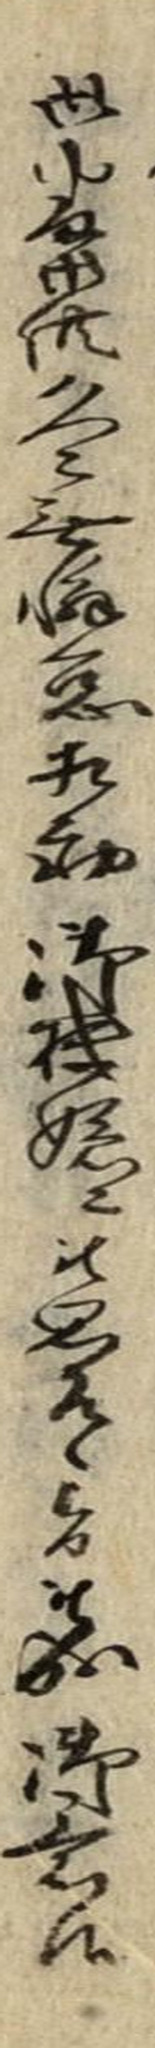御番御供久々無懈怠相勤御機嫌に被思召候旨被成御意候
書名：御用并被仰出之部
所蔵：福井県文書館 Fukui Prefectural Archives
